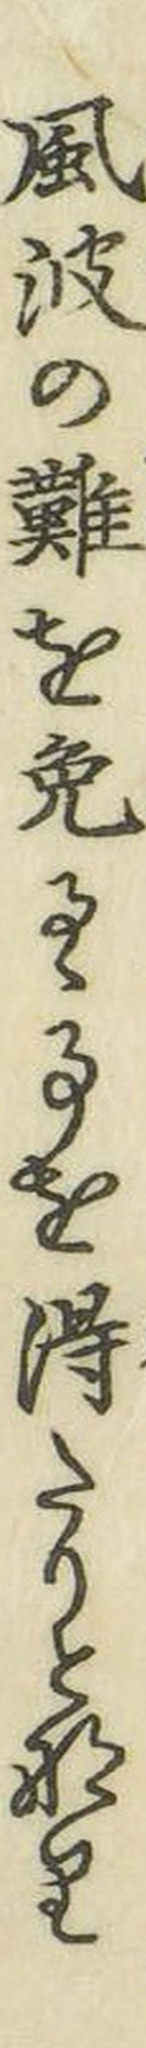風波の難を免るゝ事を得たりとなり
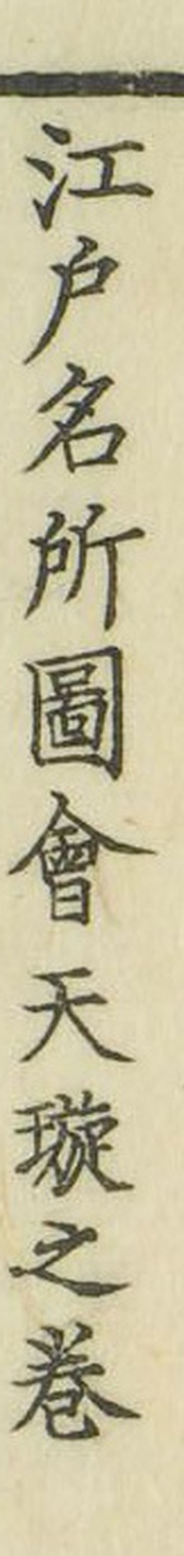江戸名所圖會天璇之巻
